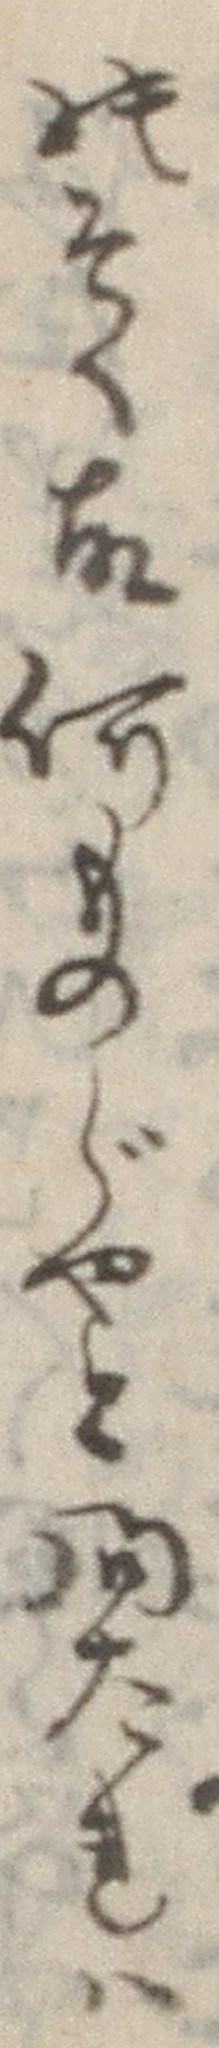のそく故何ものじやと問たれは
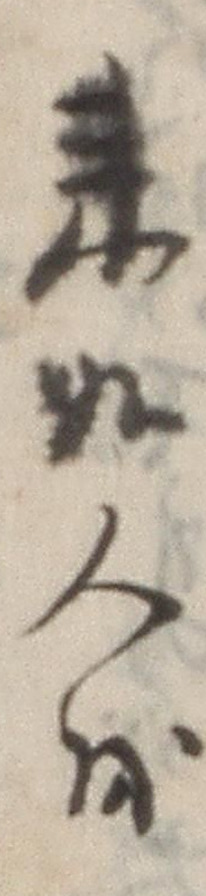来ぬ人を
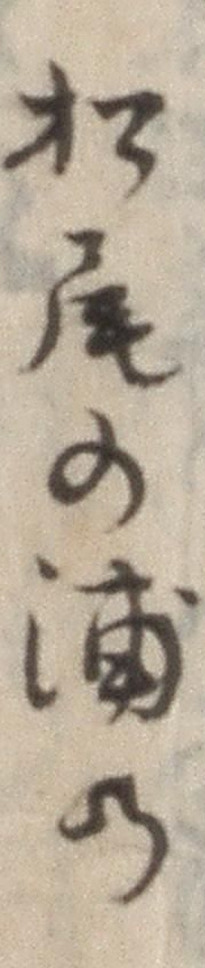松尾の浦の
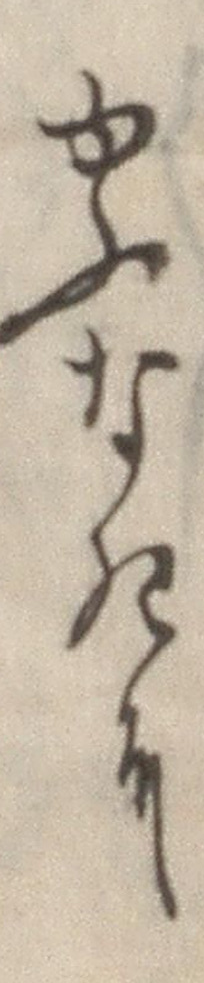ゆふなきに
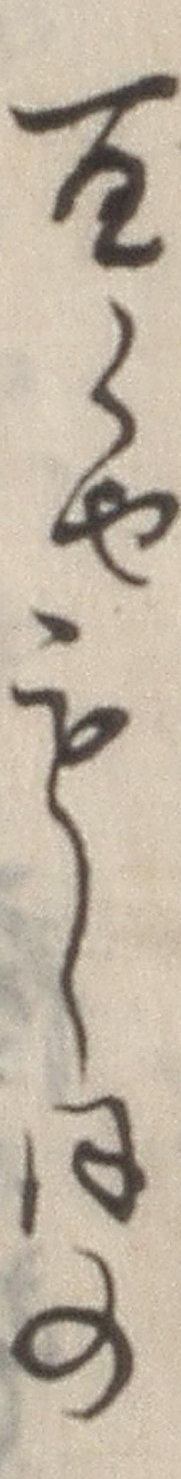やくやもしほの
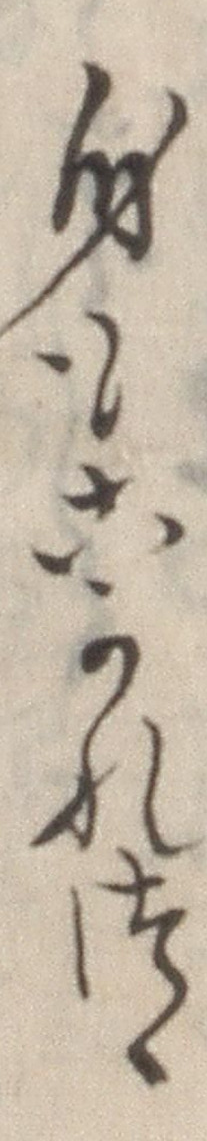身もこかれつゝ
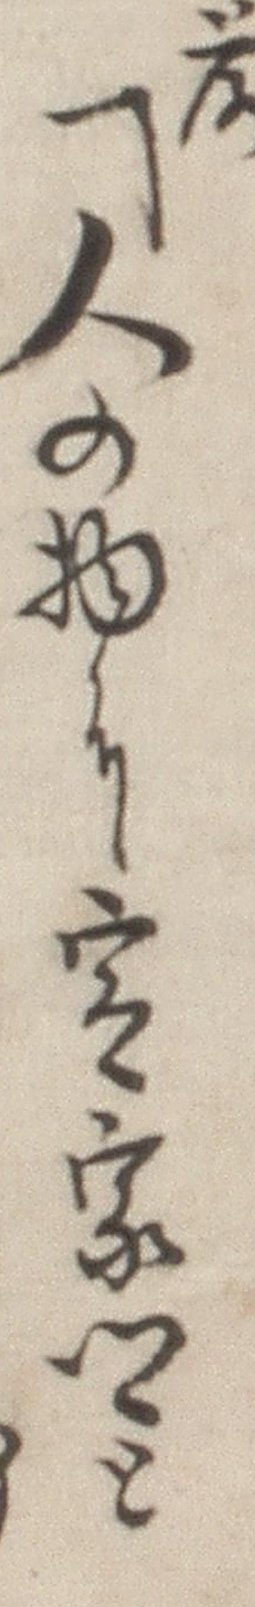落〽人の物に定家卿と
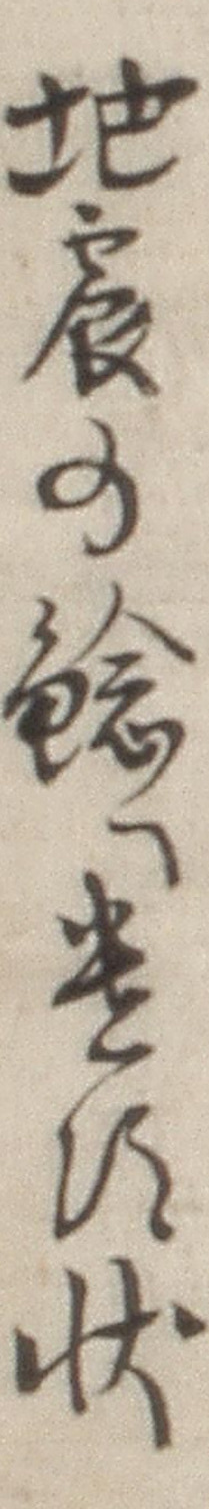地震の鯰へ遣す状
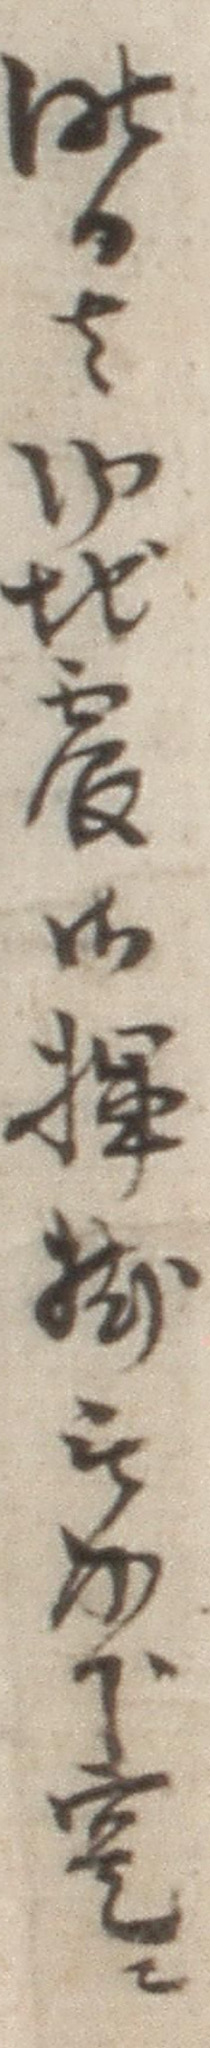昨日は御地震御揮掛被成下寔に
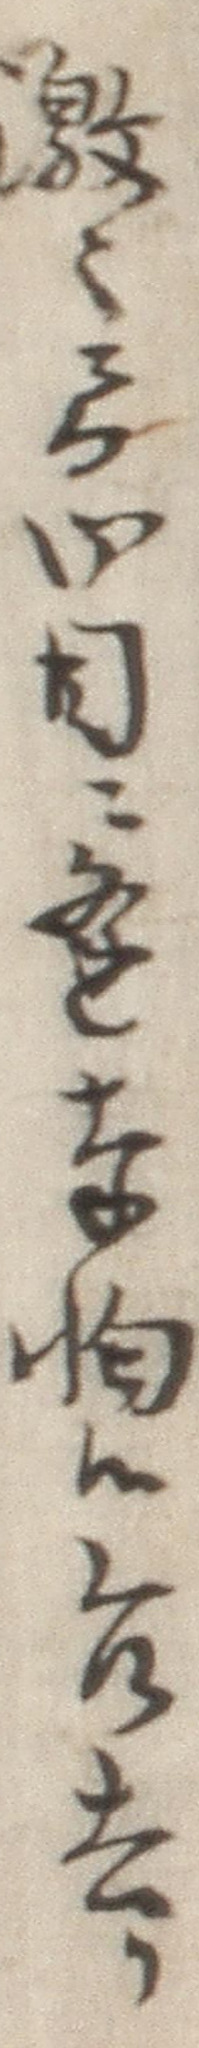激〻ニ而御目に逢奉怐候乍去り
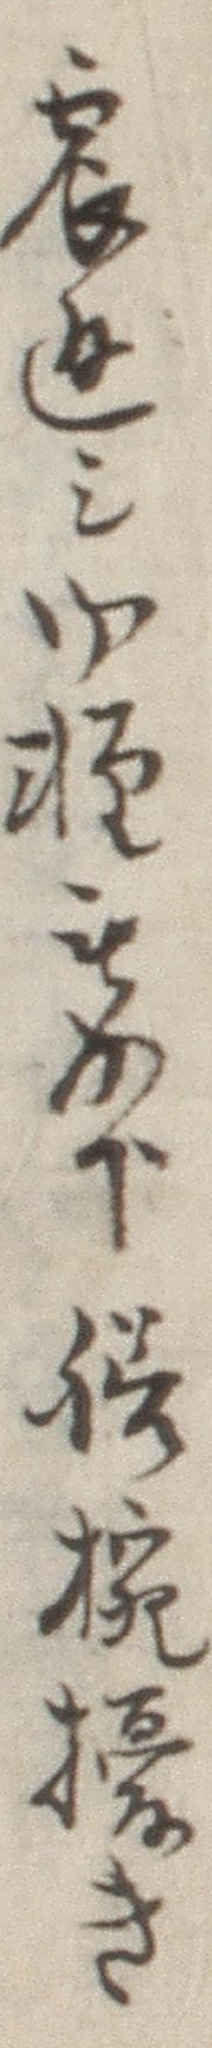震返し御軽被成下膳椀擾なき
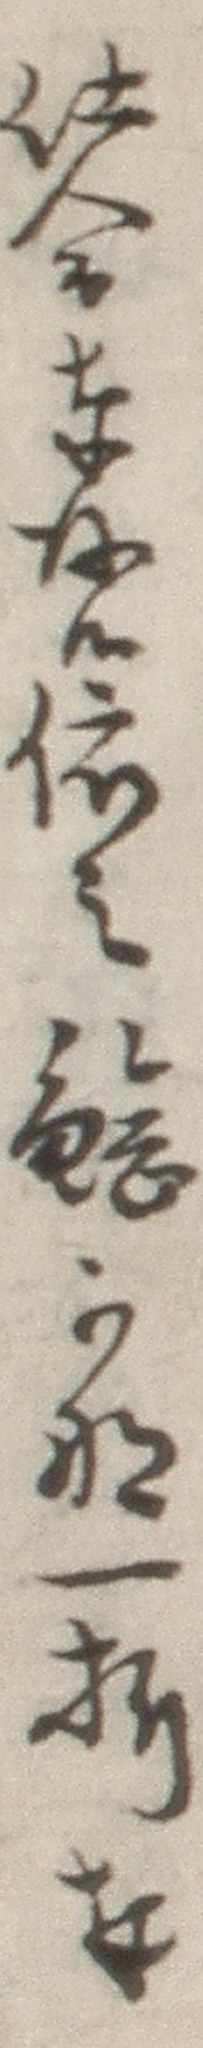仕合奉存候依之鯰かな一折奉
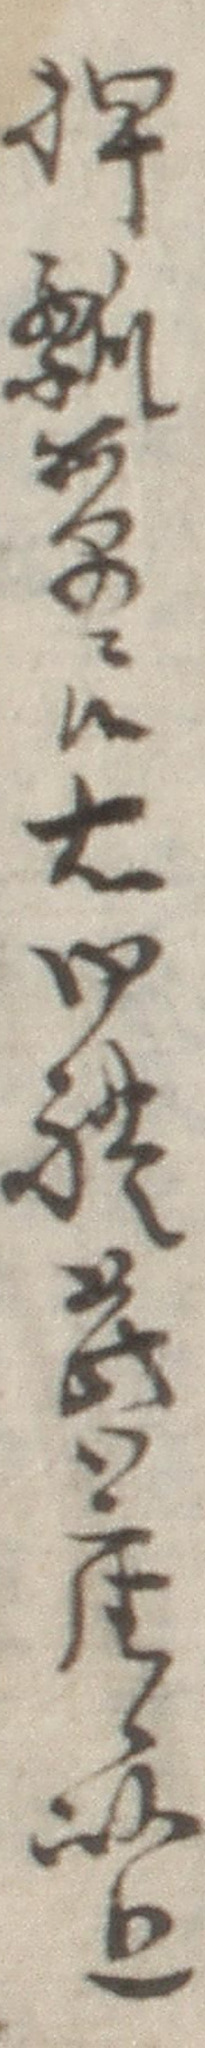押瓢箪に候右御礼如此御座候以上

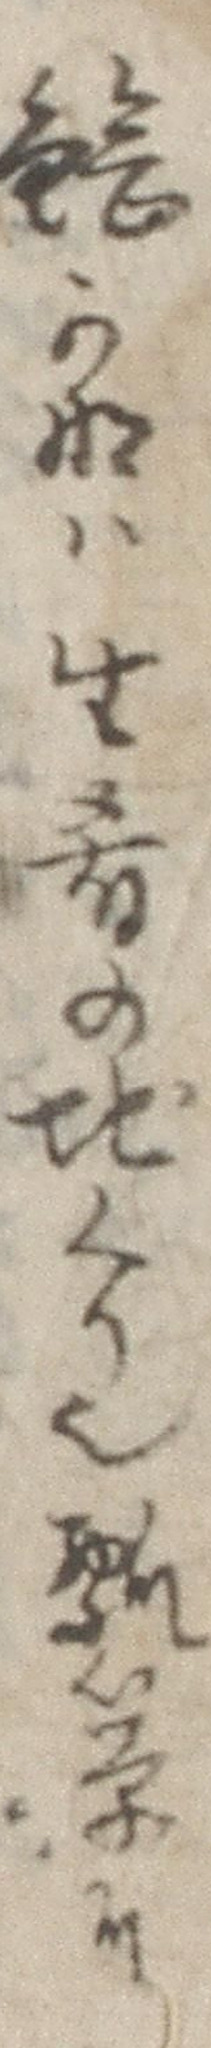鯰かなは生肴の地くり也瓢箪に
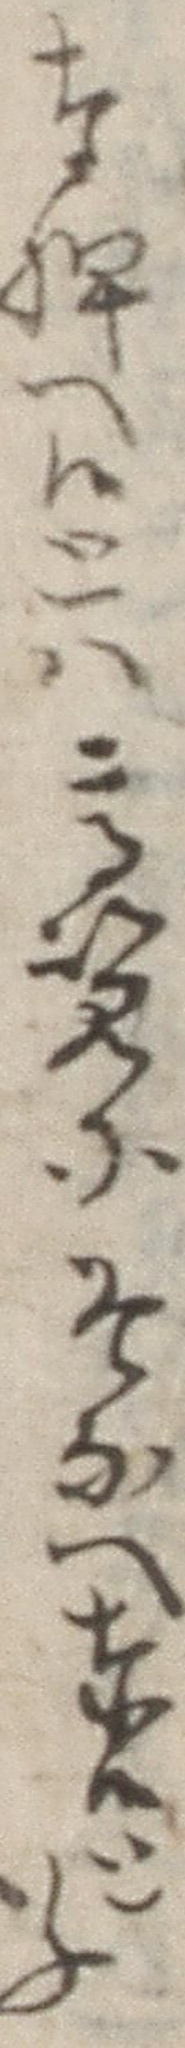奉押へ候とは高覧にそなへ奉候といふ
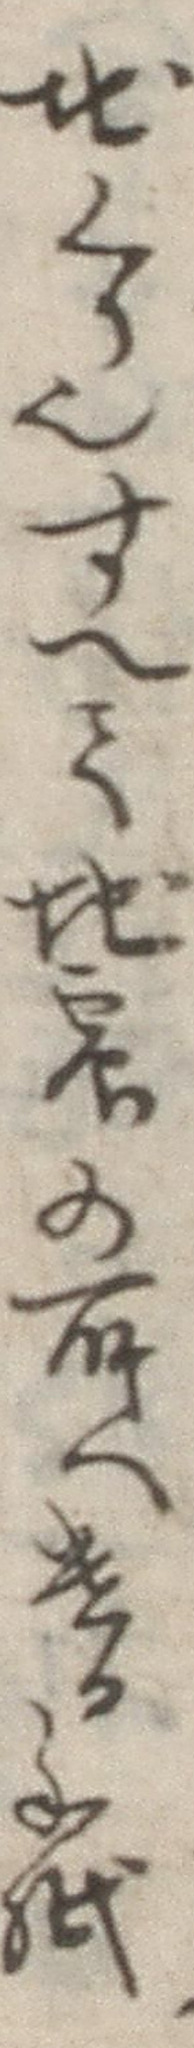地くり也すへて地震の所へ遣る手紙
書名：諸國大地震年代記末代噺種
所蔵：東京大学地震研究所図書室 Earthquake Research Institute Library, The University of Tokyo, JAPAN
